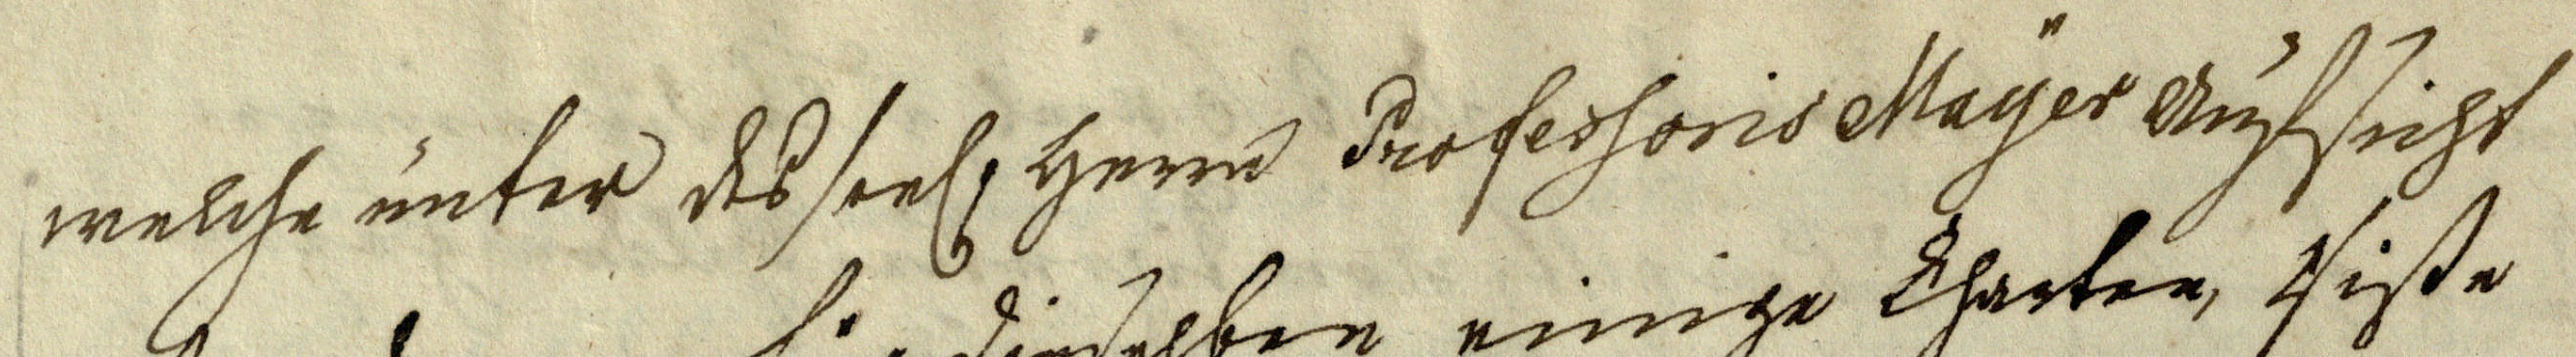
welche unter des seel. Herrn Professoris Maÿer Aufsicht
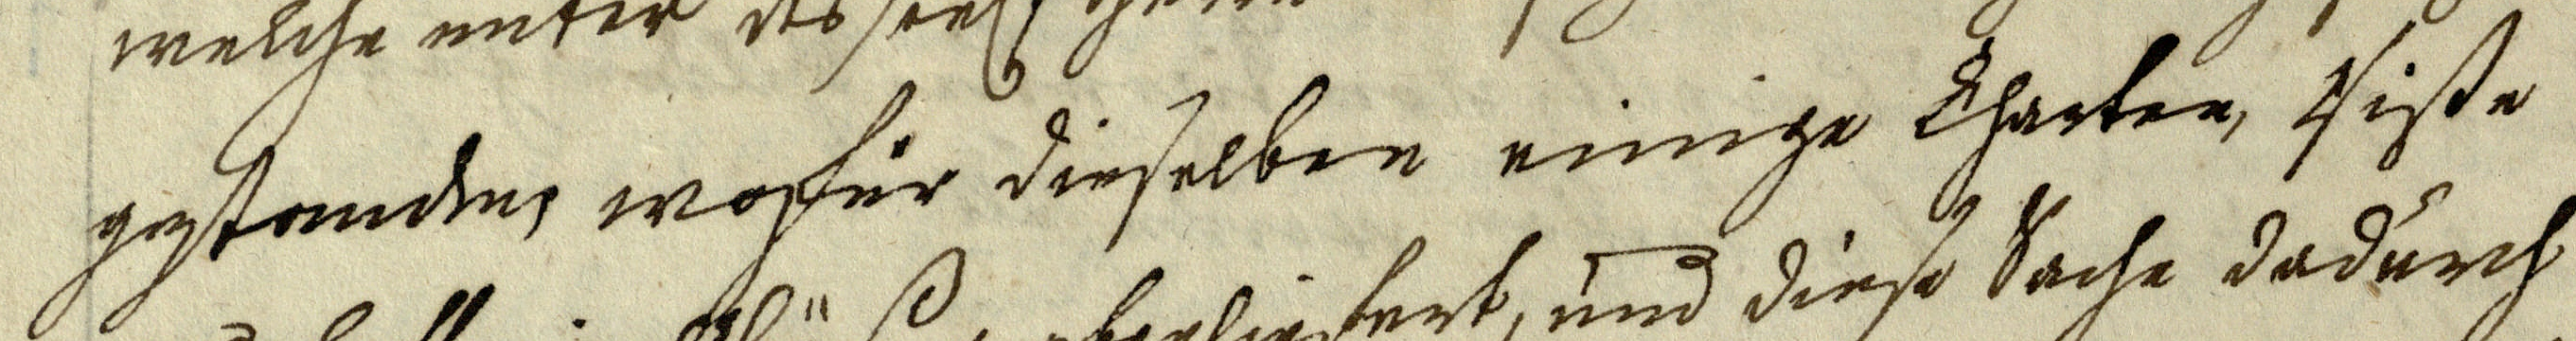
gestanden wofür dieselben einige Charten, Riße
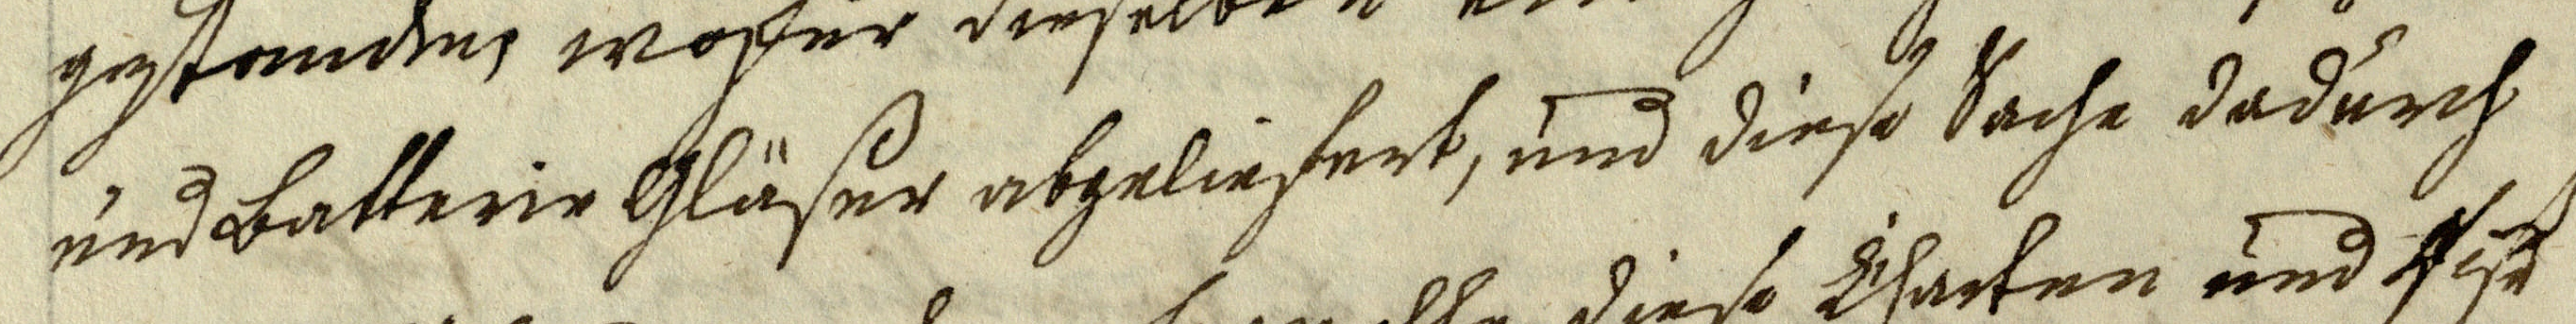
und Batterie Gläser abgeliefert, und diese Sache dadurch
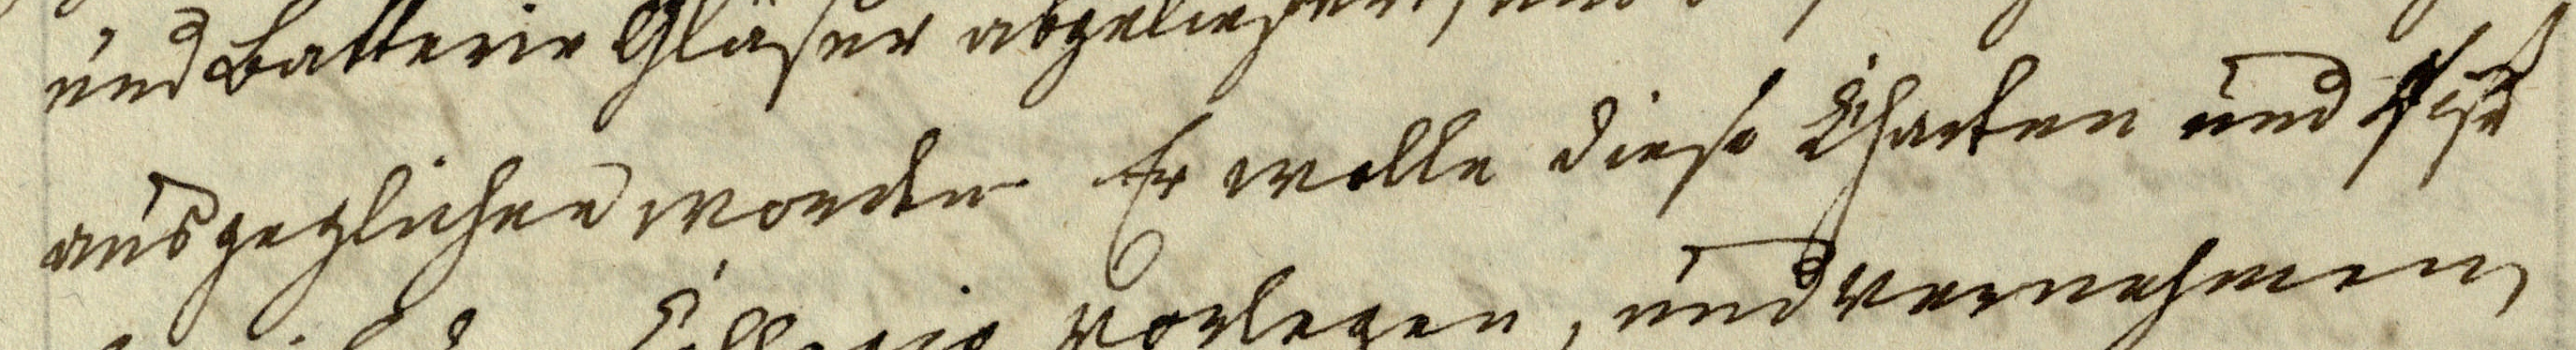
ausgeglichen worden. Er wolle diese Charten und Riße
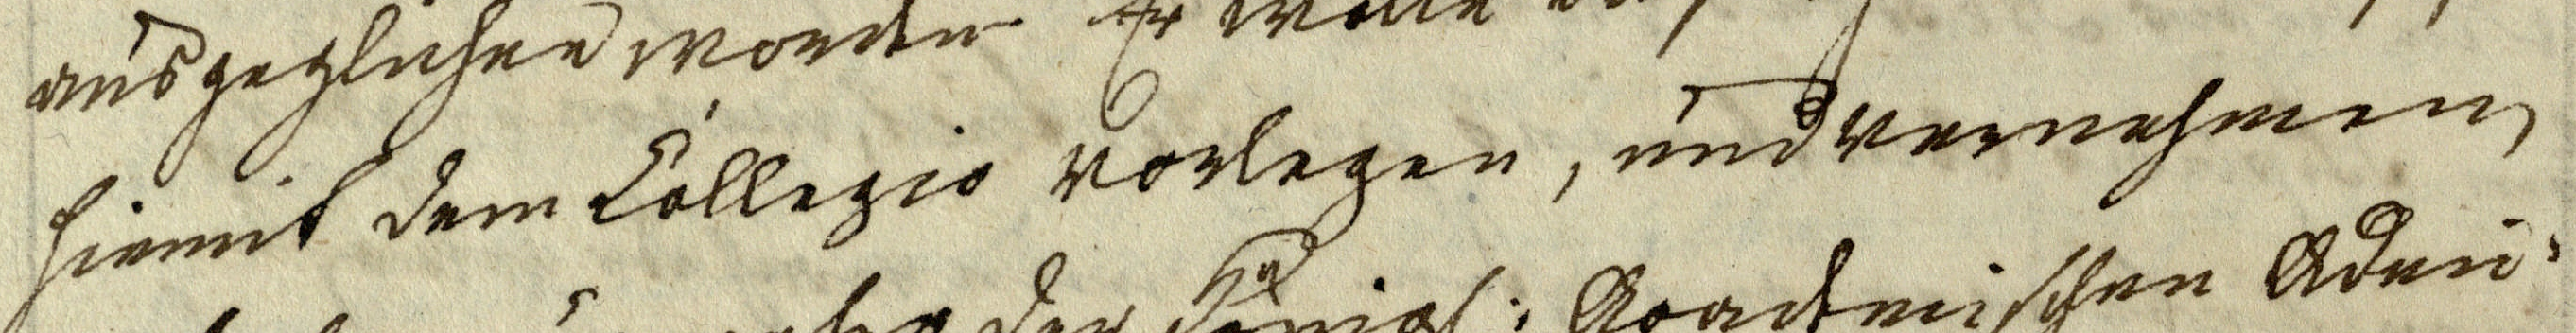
hiemit dem Collegio vorlegen, und vernehmen,
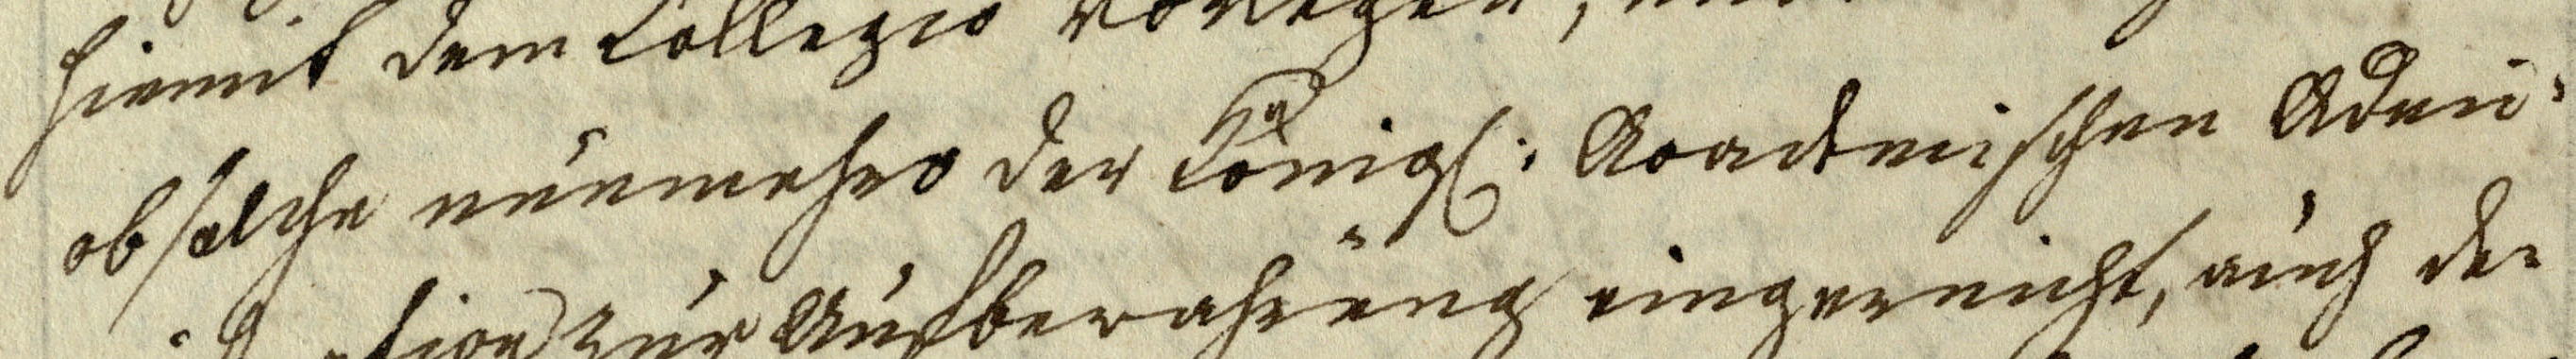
ob solche nunmehro der Königl. Academischen Admi¬
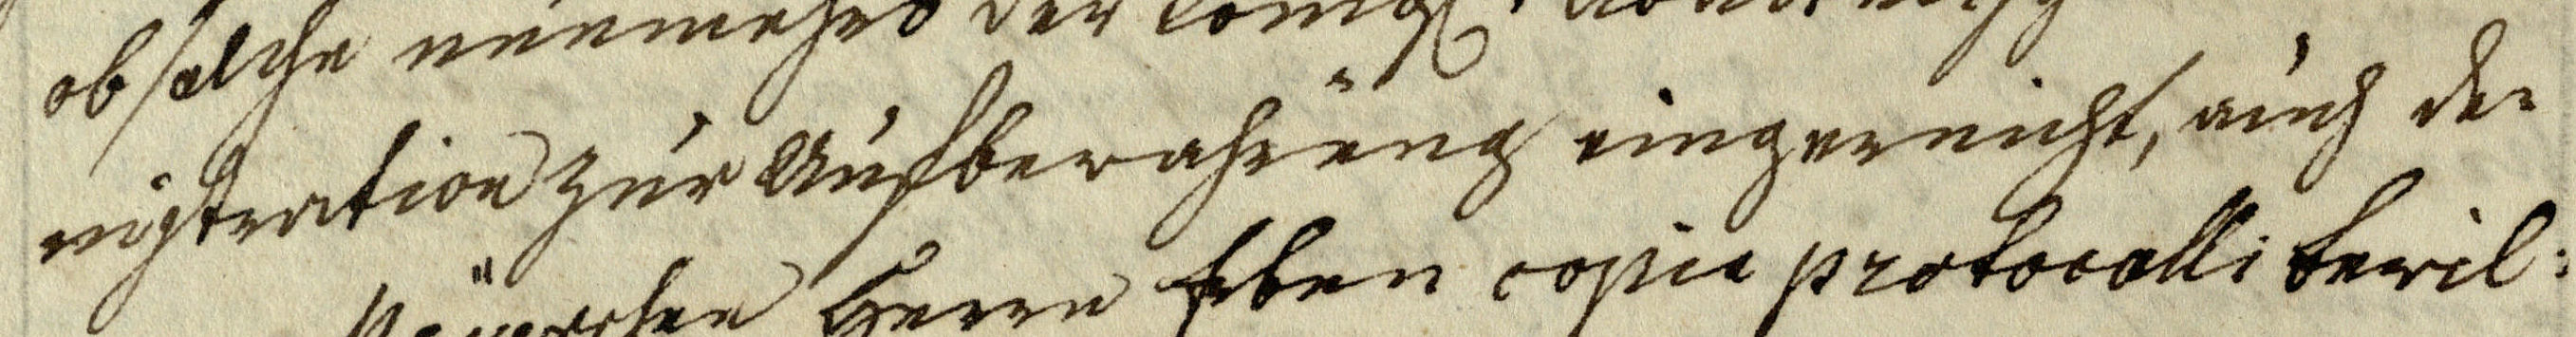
nistration zur Aufbewahrung eingereicht, auch de¬
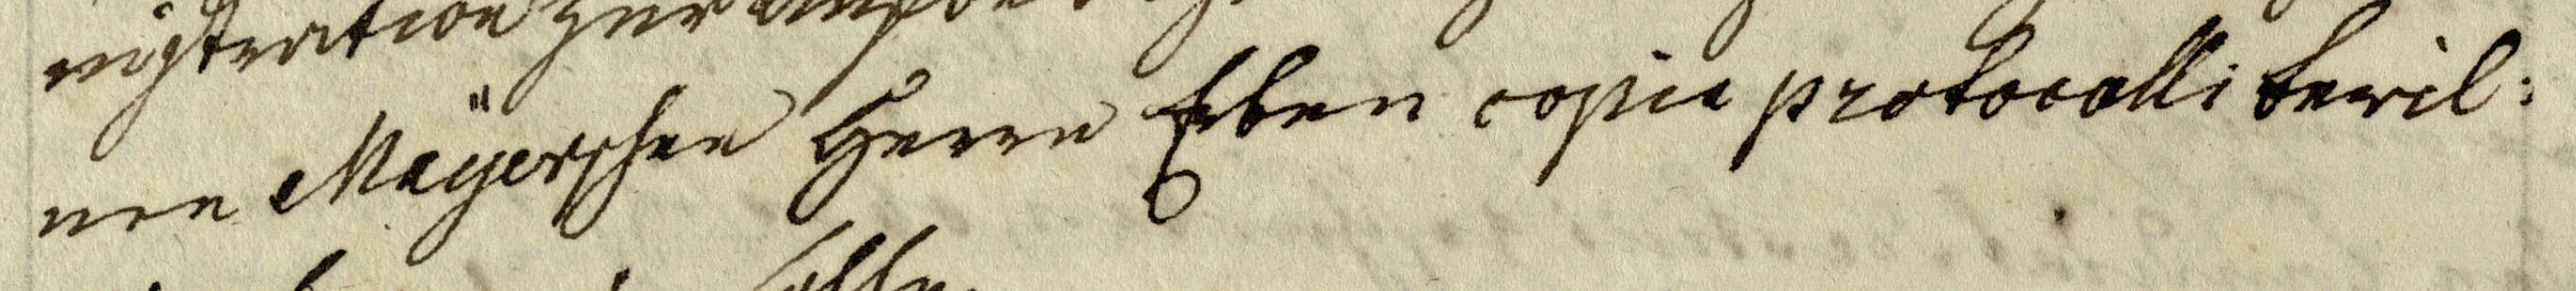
nen Maÿerschen Herrn Erben copia protocolli bewil¬
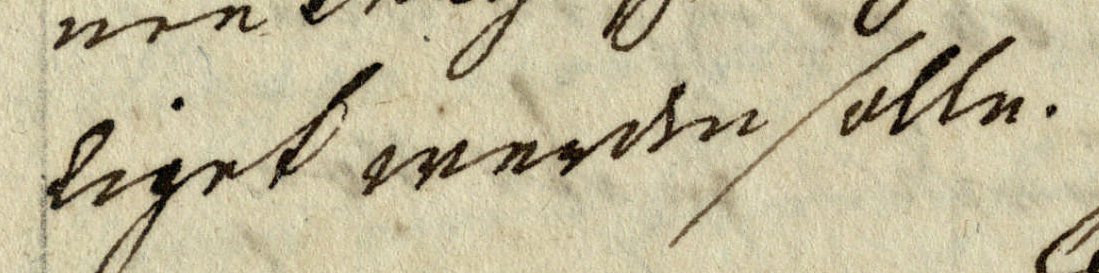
liget werden solle.
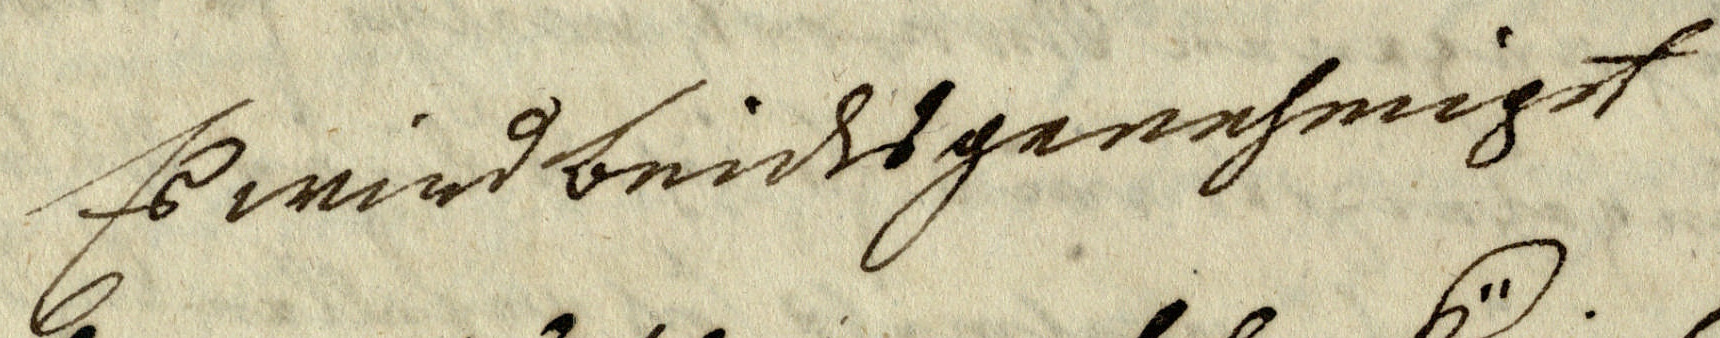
Es wird beides genehmiget.
